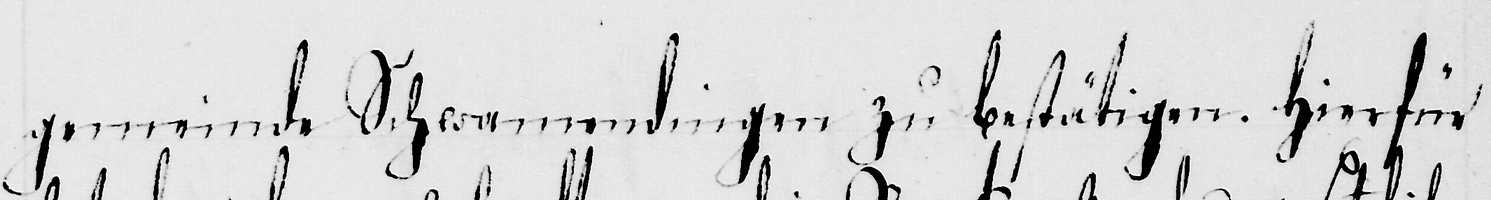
gemeinde Schwamendingen zu bestätigen. Hierfür
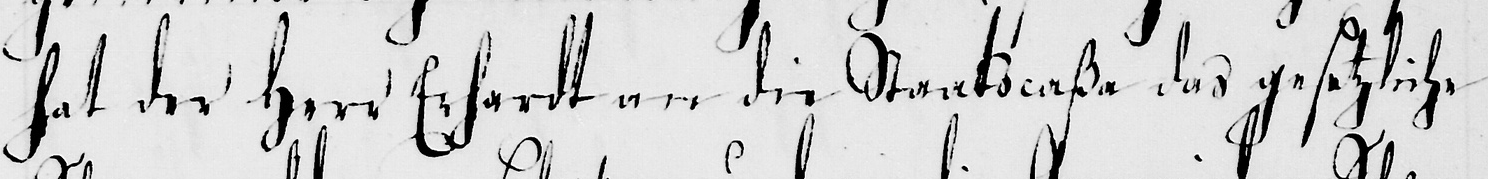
hat der Herr Erhardt an die Staatscaßa das gesetzliche
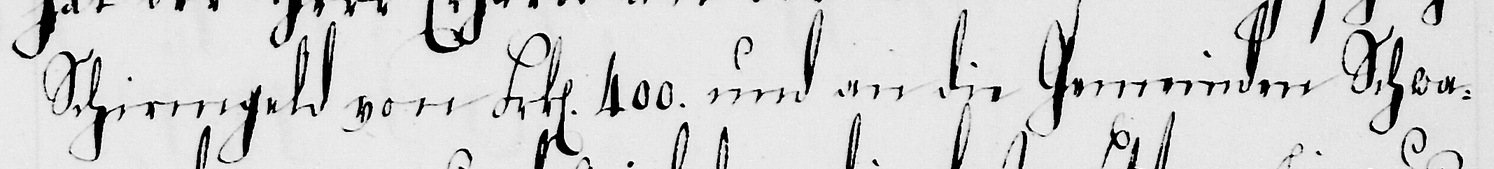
Schirmgeld von Frk[en]. 400. und an die Gemeinden Schwa¬
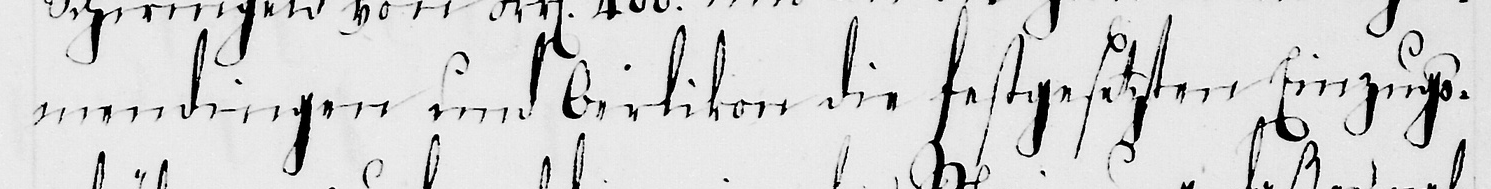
mendingen und Oerlikon die festgesetzten Einzugs¬
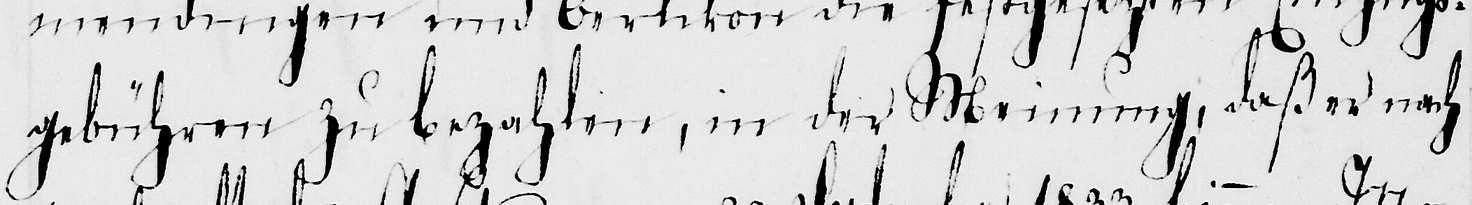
gebühren zu bezahlen, in der Meinung, daß er nach
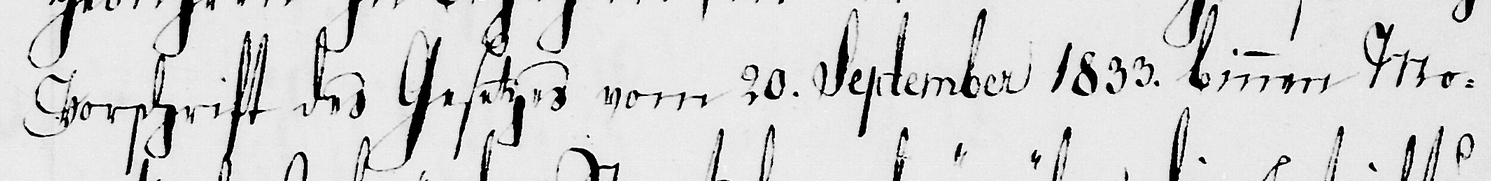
Vorschrift des Gesetzes vom 20. September 1833. binnen Mo¬
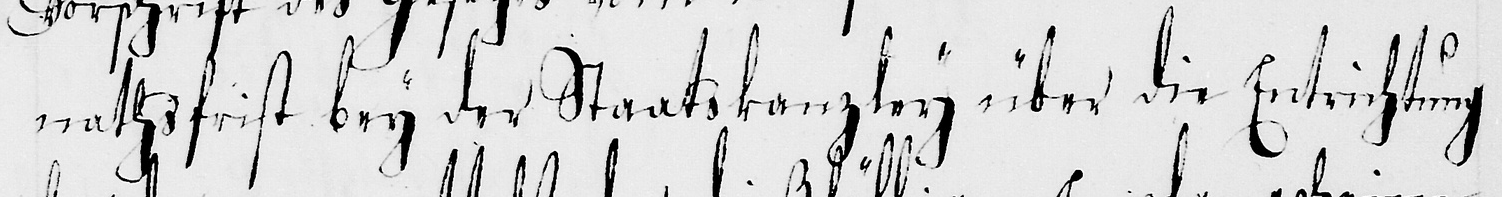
nathsfrist bey der Staatskanzley über die Entrichtung
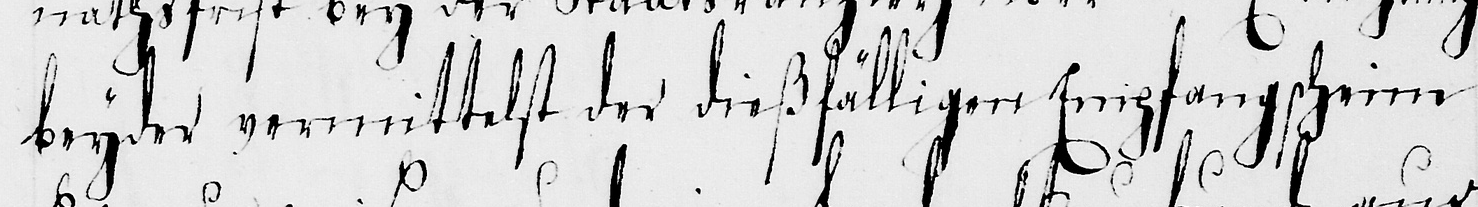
beyder vermittelst der dießfälligen Empfangscheine
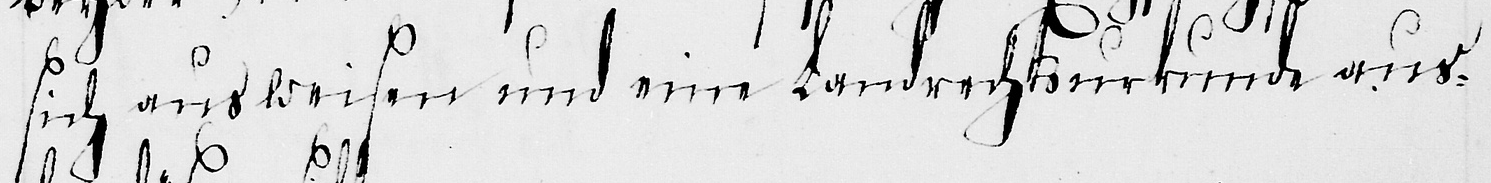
sich ausweisen und eine Landrechtsurkunde aus¬
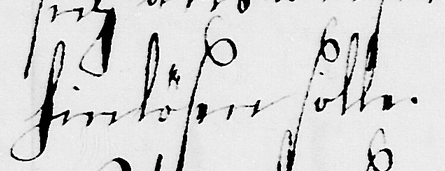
hinlösen sol¬
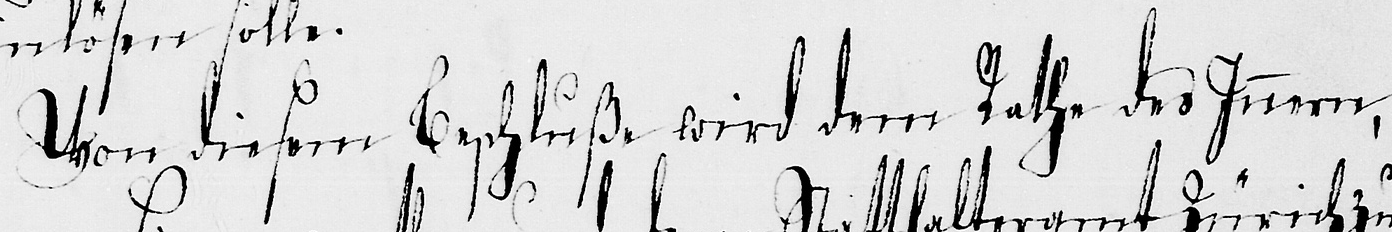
Von diesem Beschluße wird dem Rathe des Inner¬
